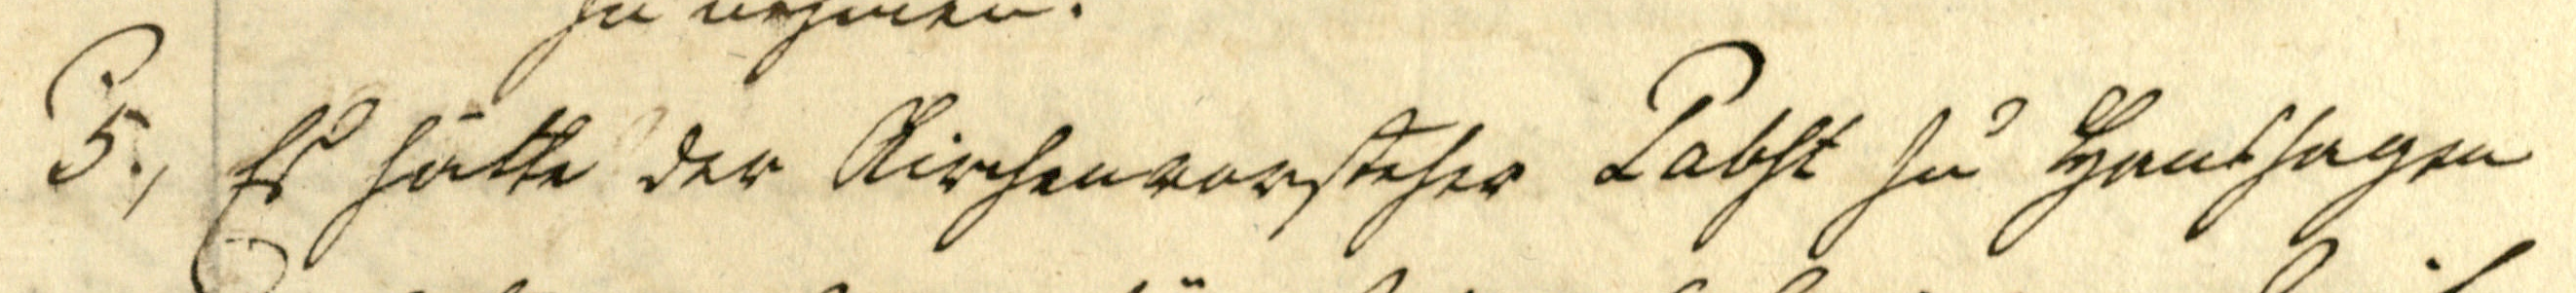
5., Es hätte der Kirchenvorsteher Pabst zu Hanshagen
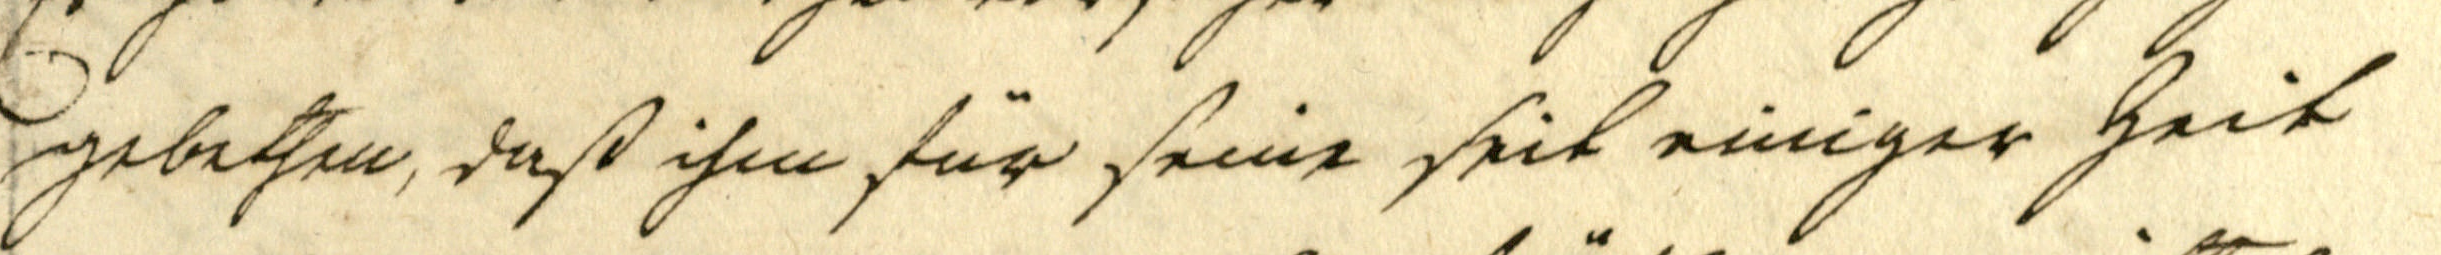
gebethen, daß ihm für seine seit einiger Zeit
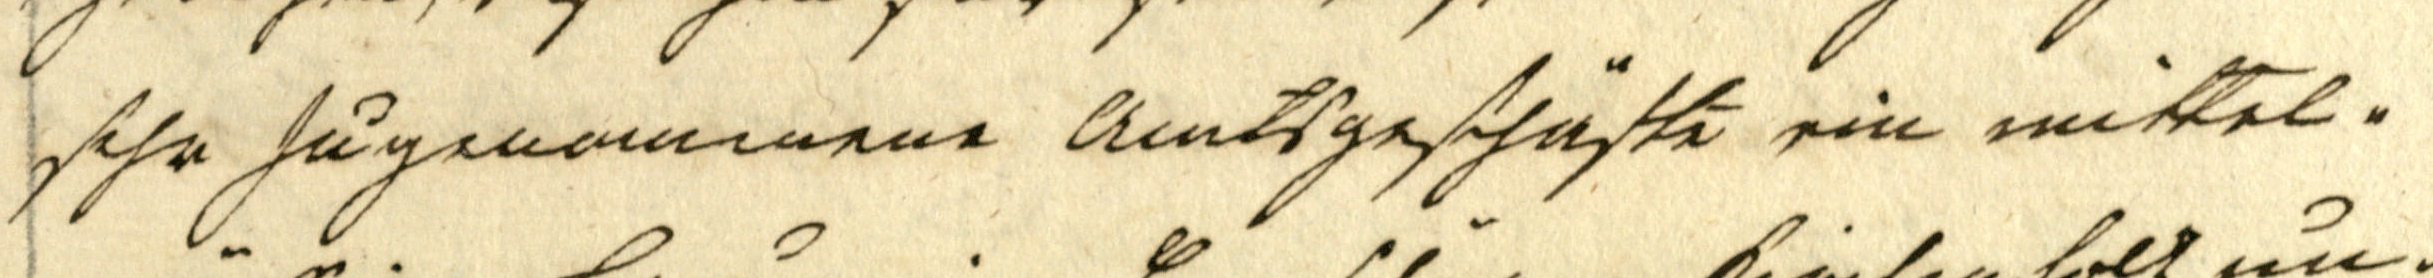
sehr zugenommene Amtsgeschäfte ein mittel¬
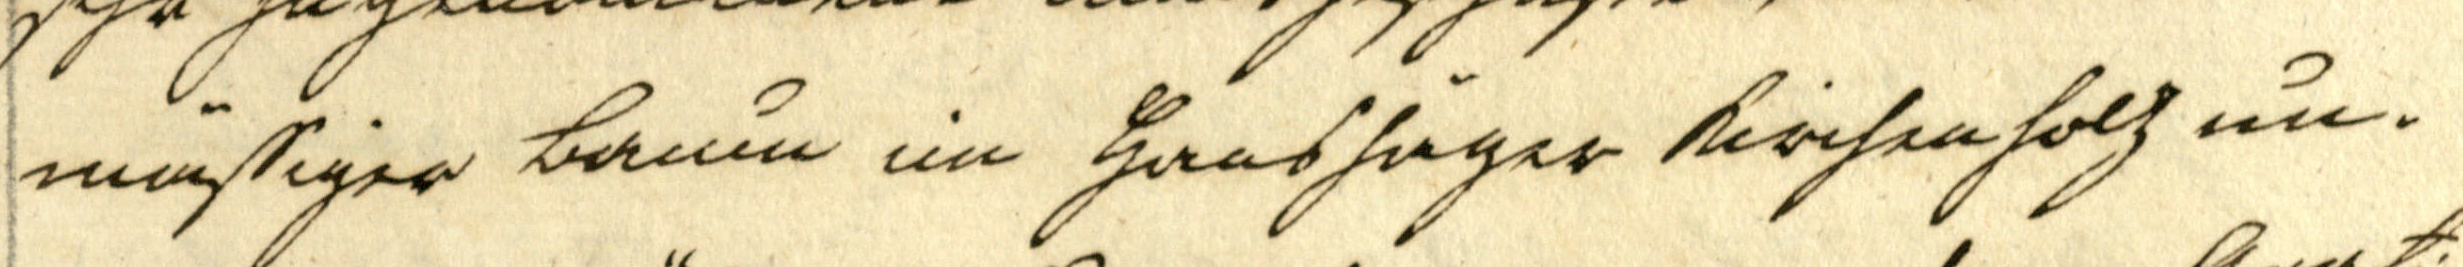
mässiger Baum im Hanshäger Kirchenholz un¬
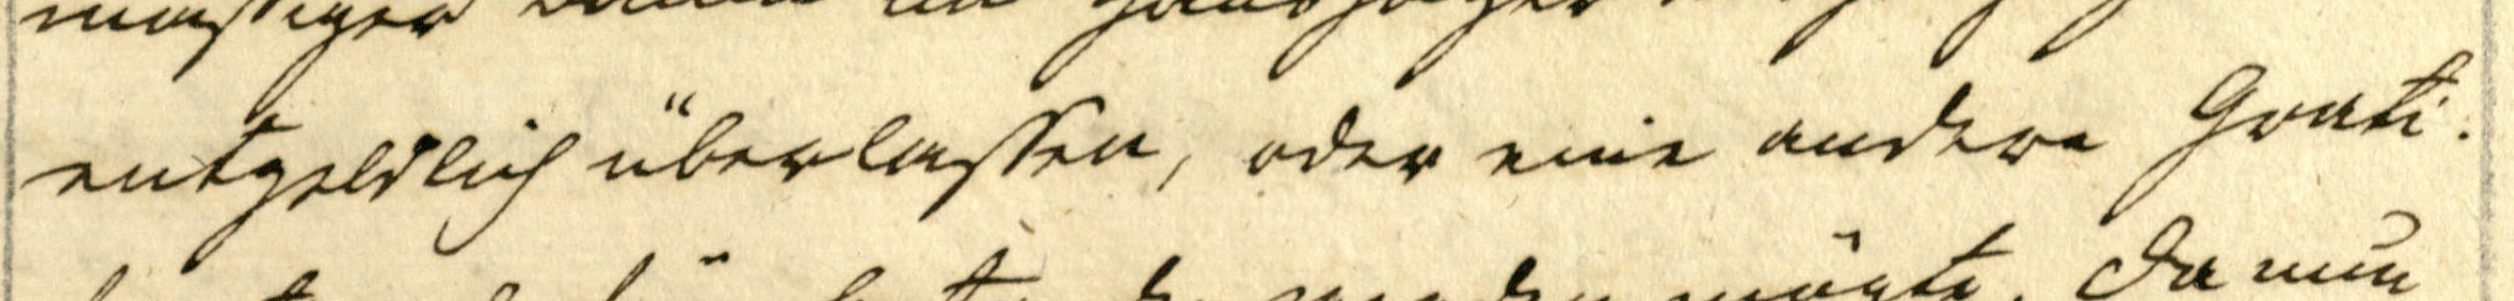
entgeldlich überlassen, oder eine andere Grati¬
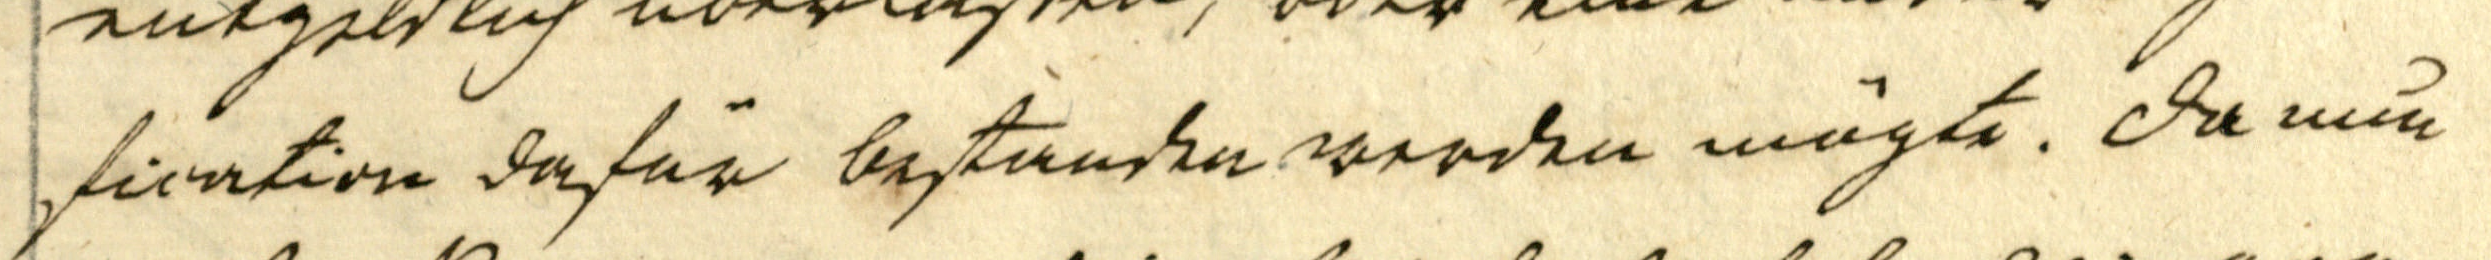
fication dafür bestanden werden mögte. Da nun
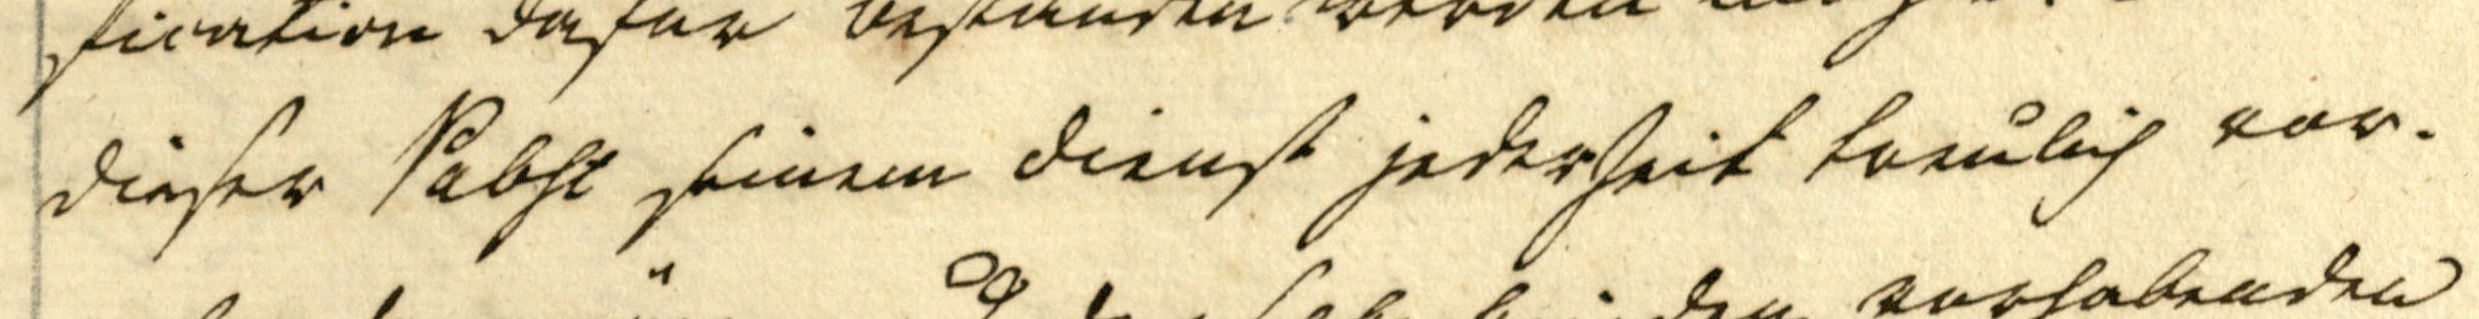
dieser Pabst seinem Dienst jederzeit treulich vor¬
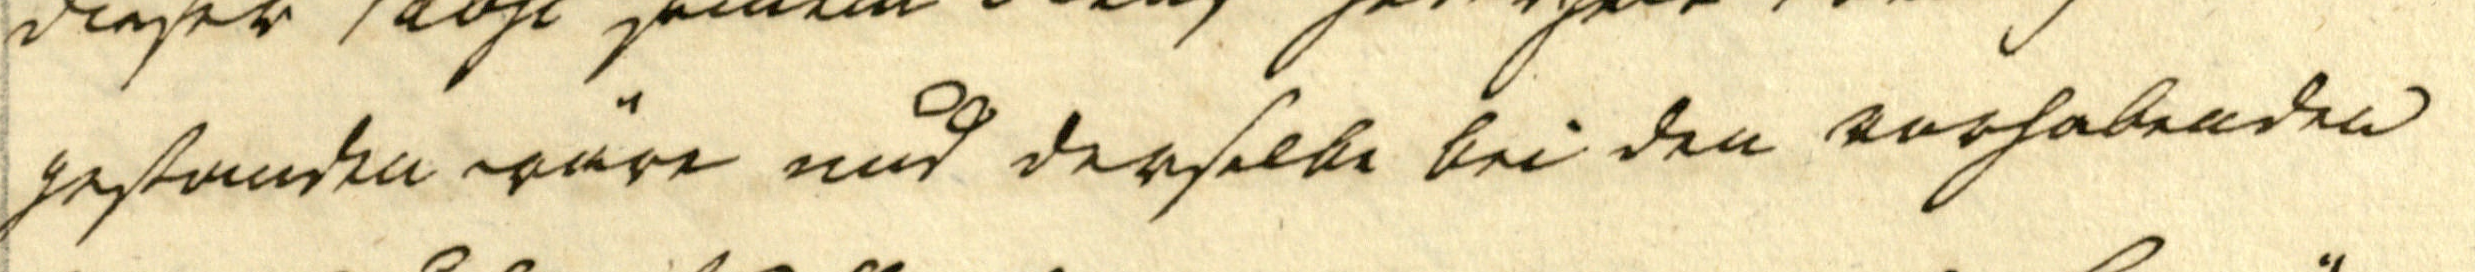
gestanden wäre und derselbe bei den vorhabenden
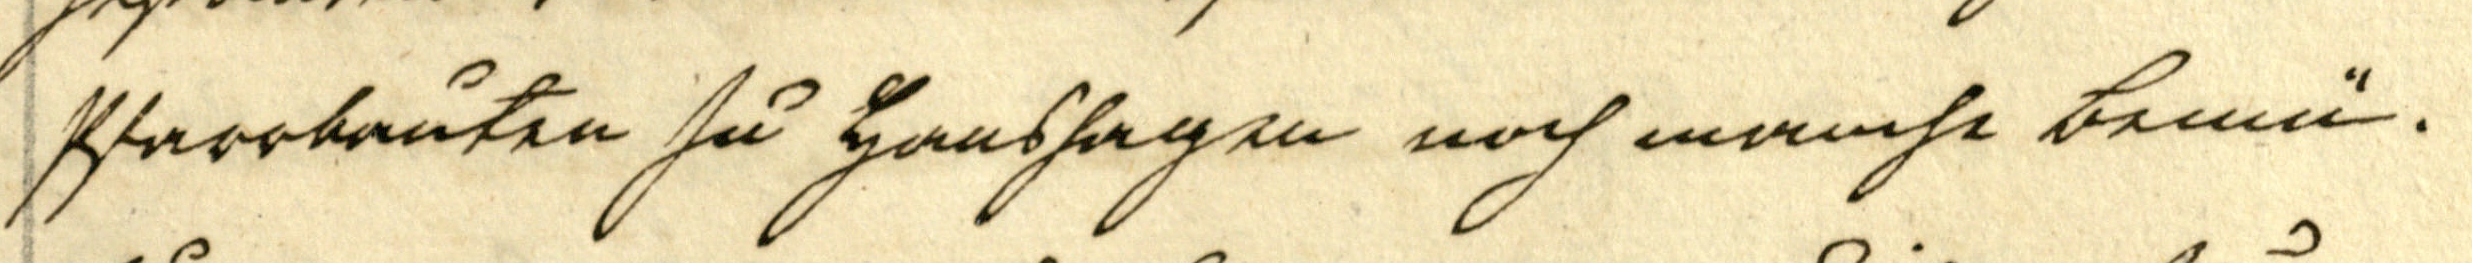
Pfarrbauten zu Hanshagen noch manche Bemü¬
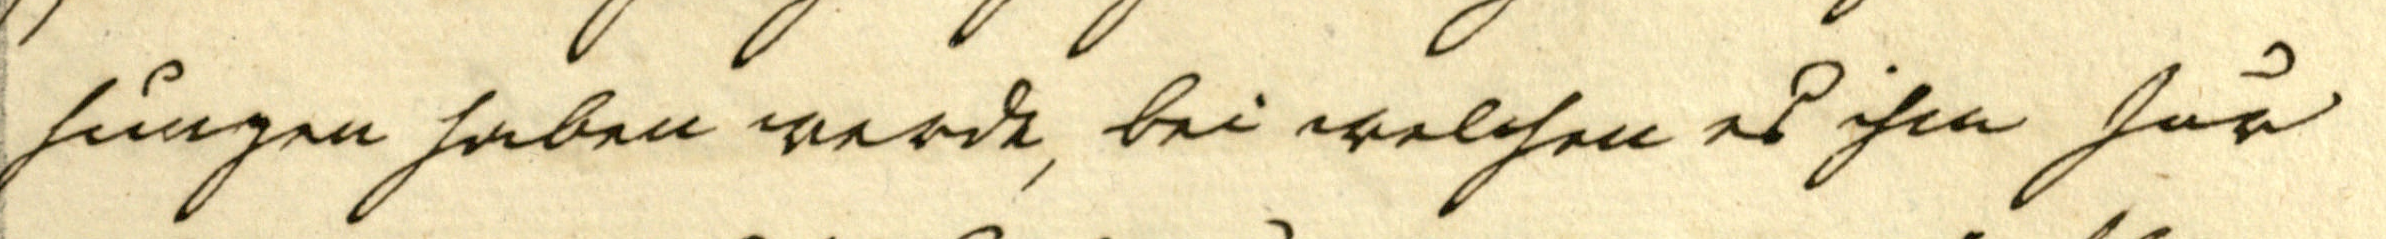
hungen haben werde, bei welchen es ihm zur
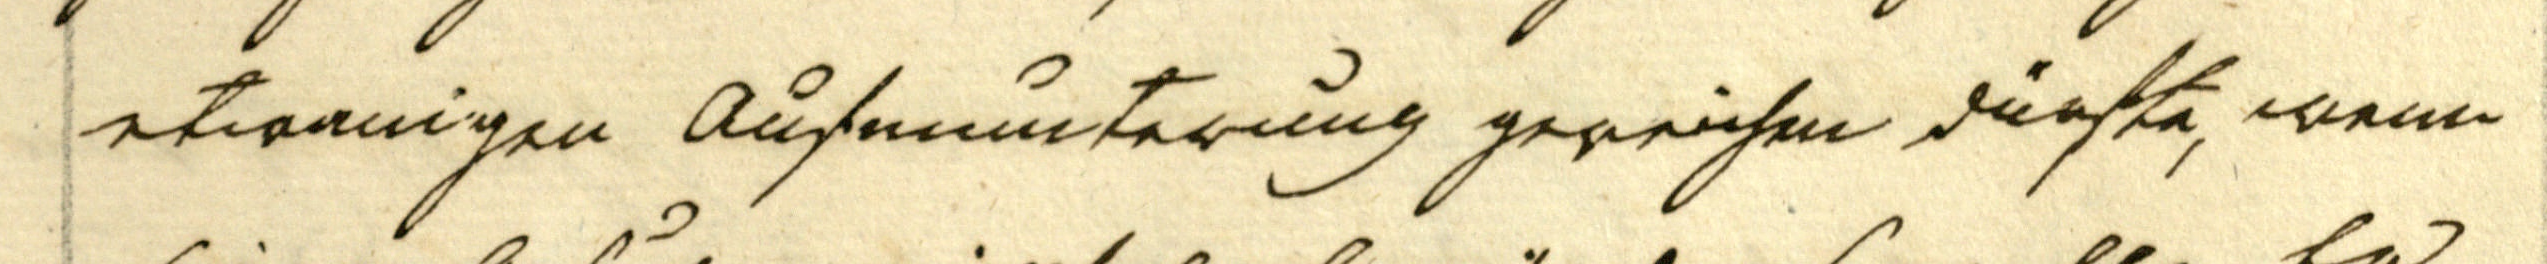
etwanigen Aufmunterung gereichen dürfte, wenn
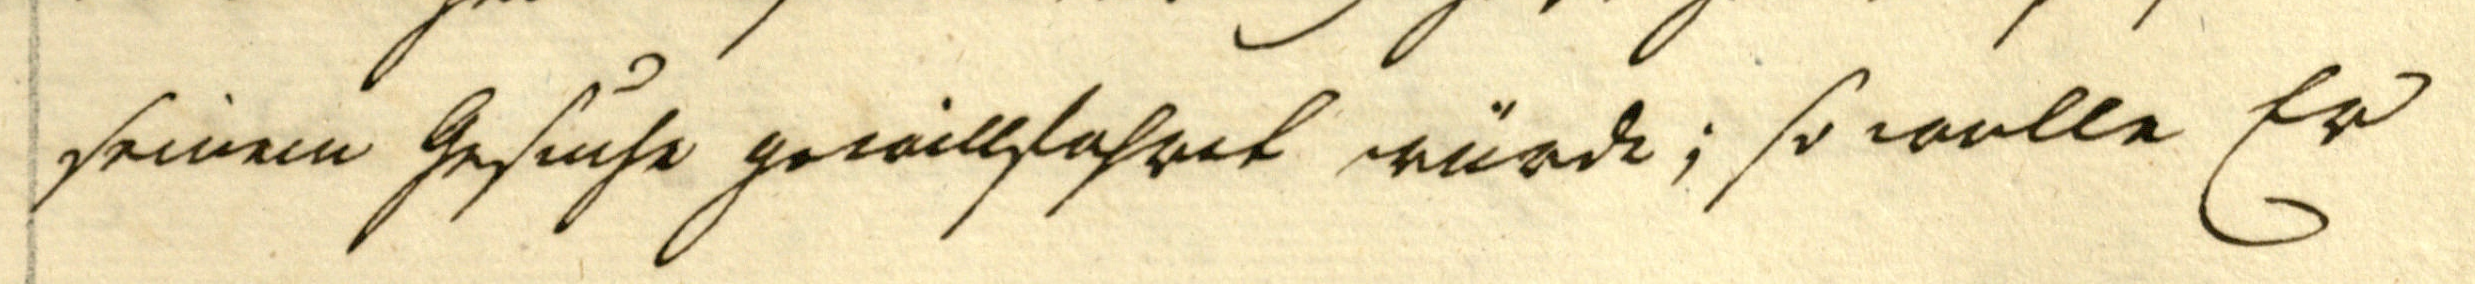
seinem Gesuche gewillfahret würde; so wolle Er
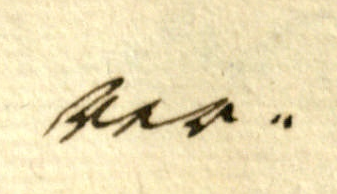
ver-
